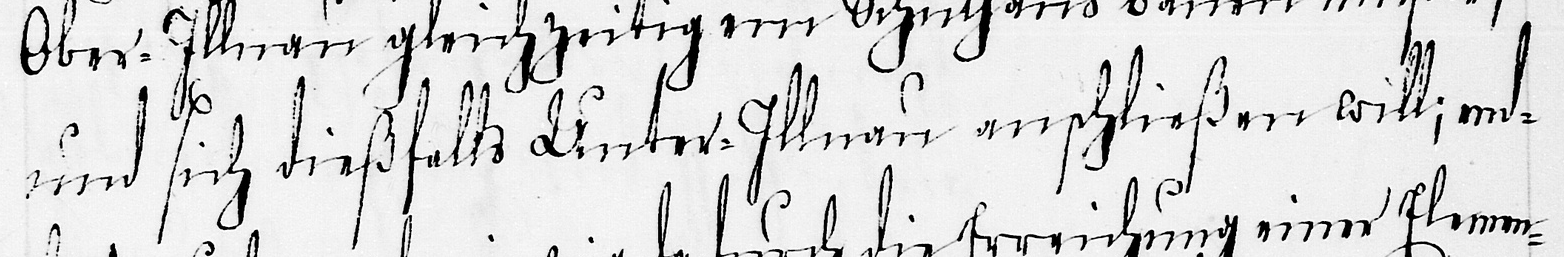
und sich dießfalls Unter-Illnau anschließen will; end¬
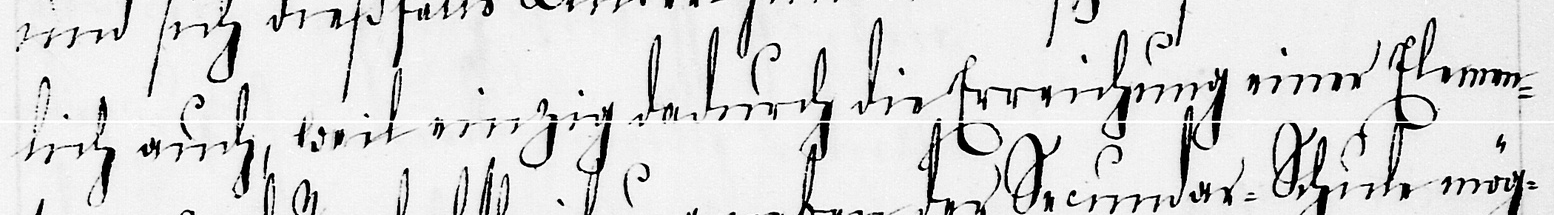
lich auch, weil einzig dadurch die Erreichung einer Elemen¬
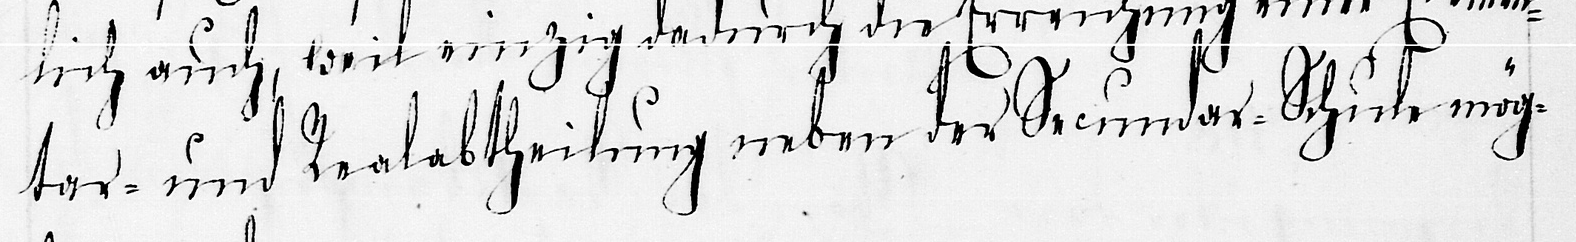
tar- und Realabtheilung neben der Secundar-Schule mög¬
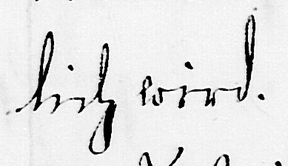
lich wird.
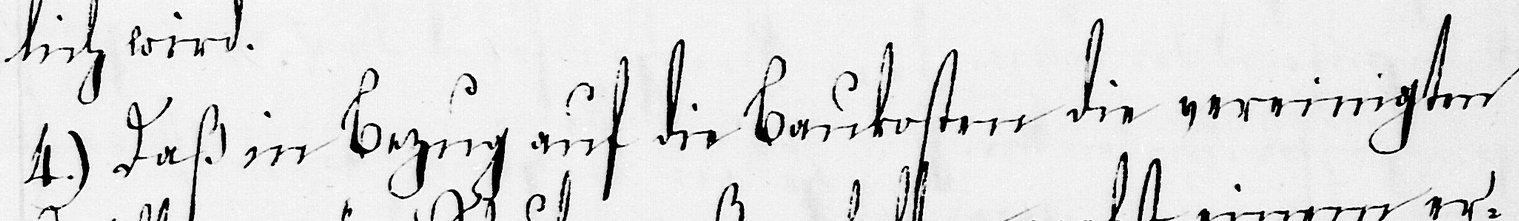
4.) Daß in Bezug auf die Baukosten die vereinigten
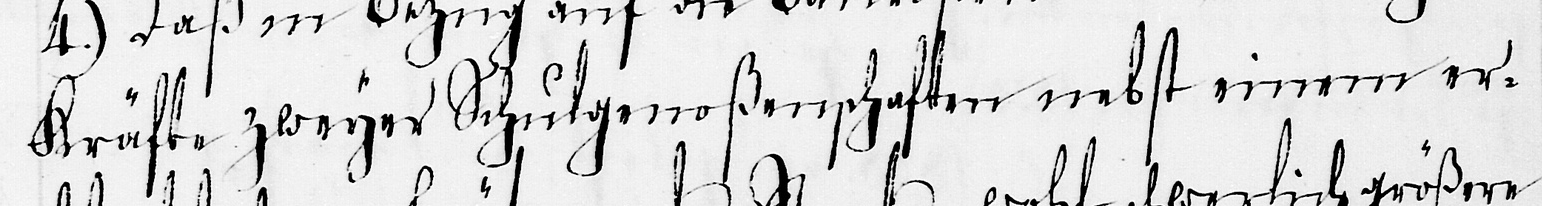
Kräfte zweyer Schulgenoßenschaften nebst einem er¬
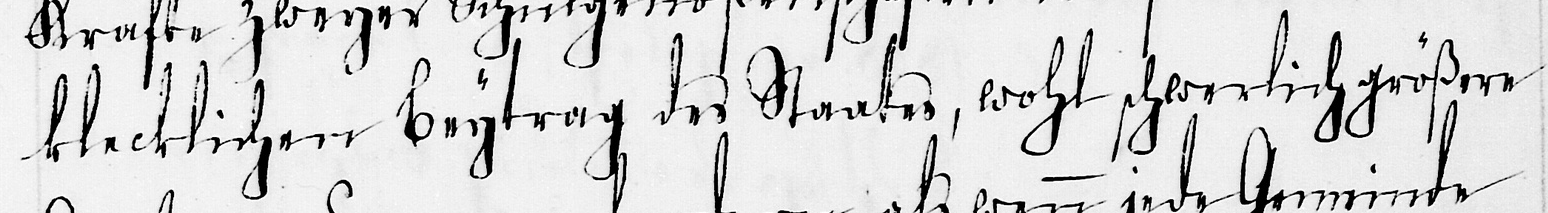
klecklichen Beytrag des Staates, wohl schwerlich größere
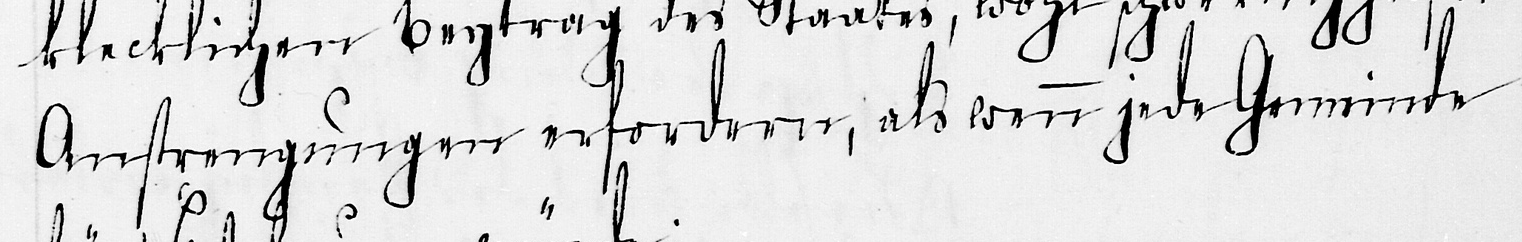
Anstrengungen erfordern, als wenn jede Gemeinde
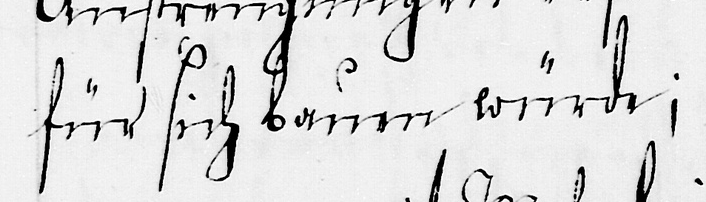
für sich bauen würde;
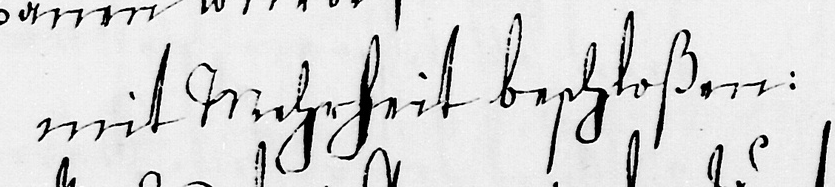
mit Mehrheit beschloßen:
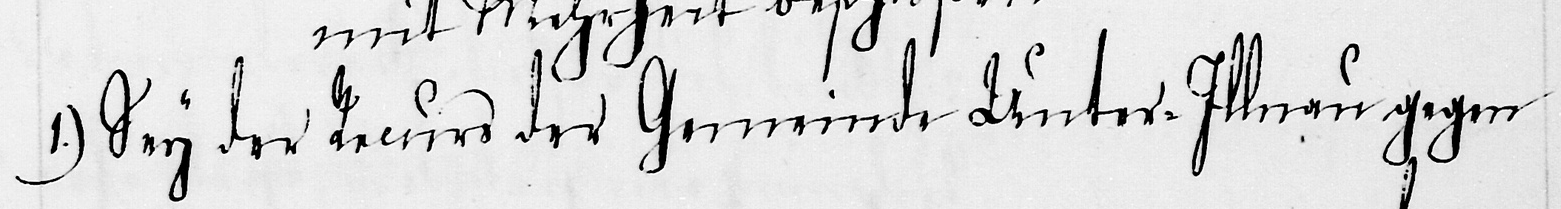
1.) Sey der Recurs der Gemeinde Unter-Illnau gegen
